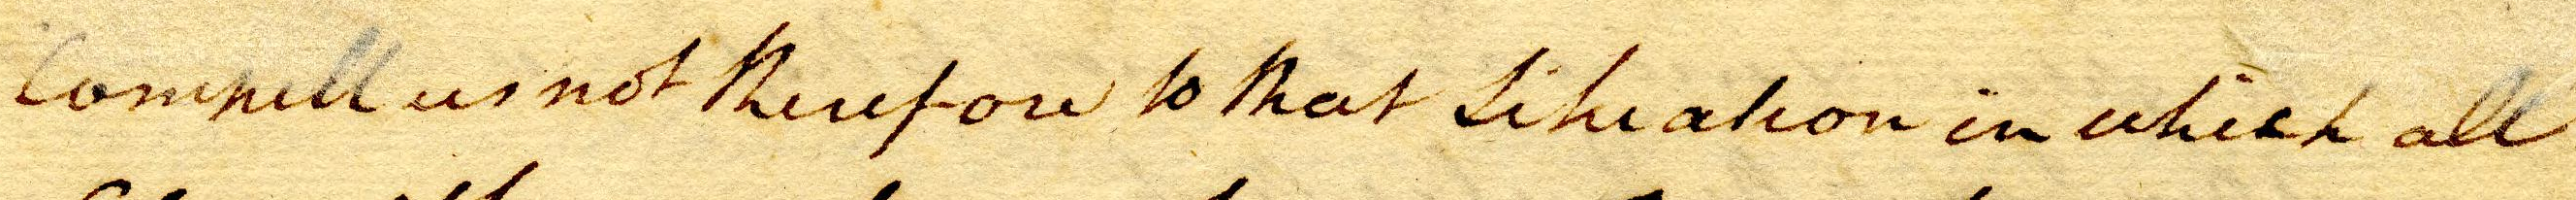Compell us not therefore to that situation in which all
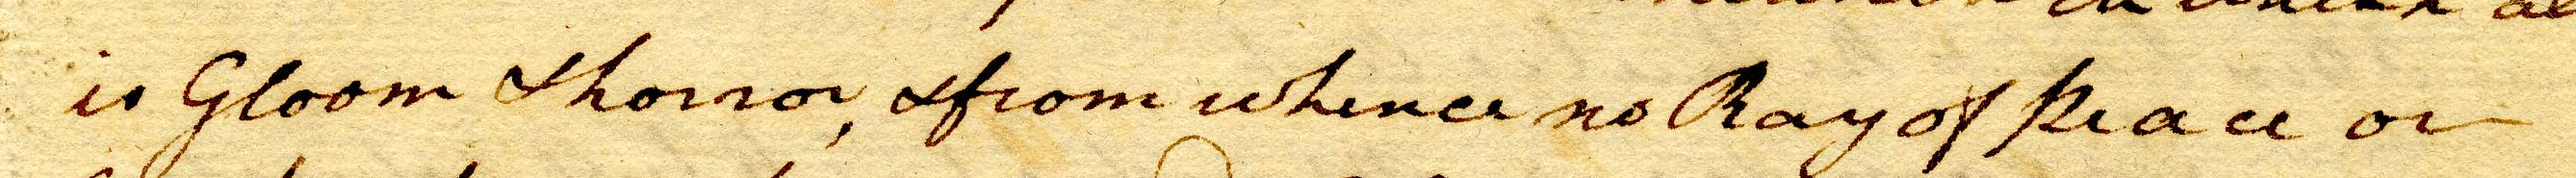is Gloom & horror, & from whence no Ray of Peace or
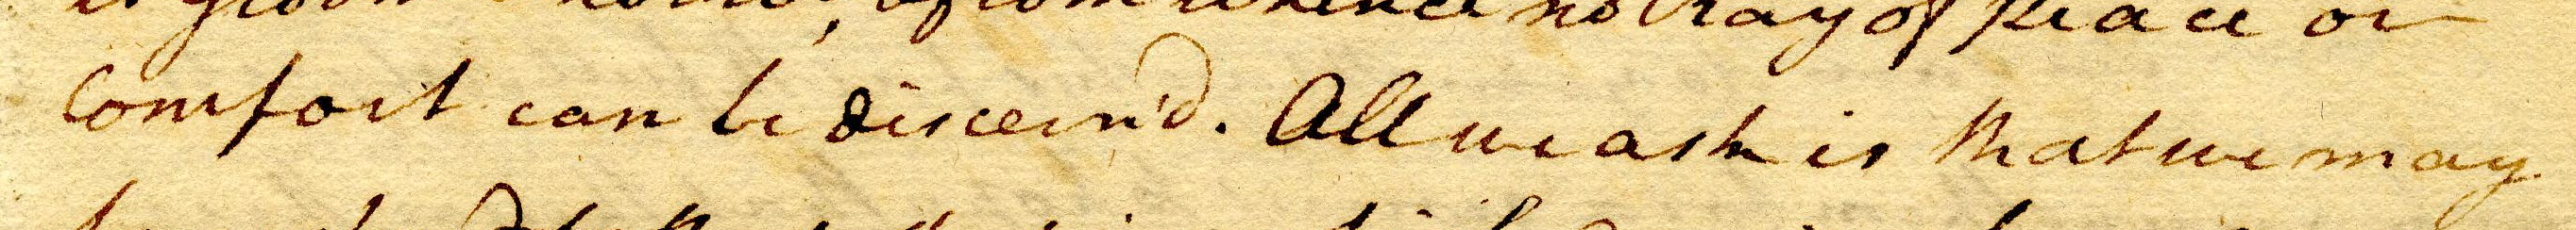Comfort can be discern'd. All we ask is that we may
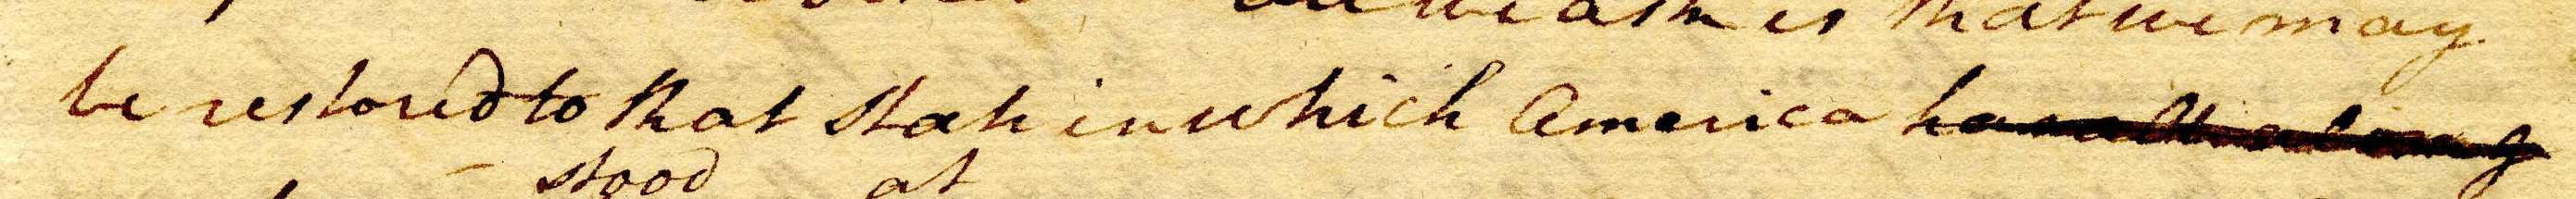be restored to that state in which America [_____________]
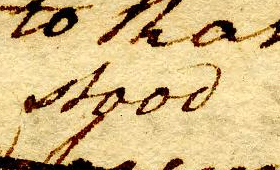stood
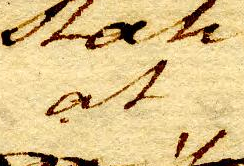at
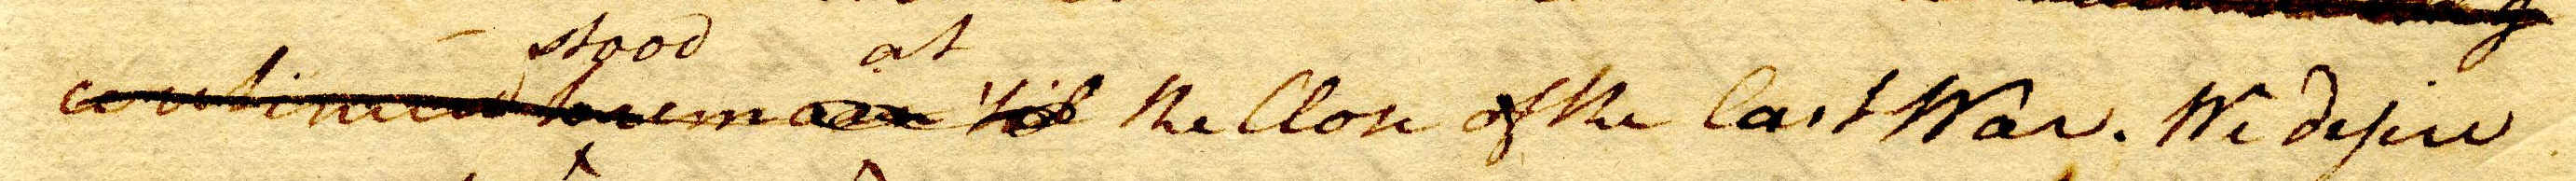[_________________] the Close of the last War. We desire
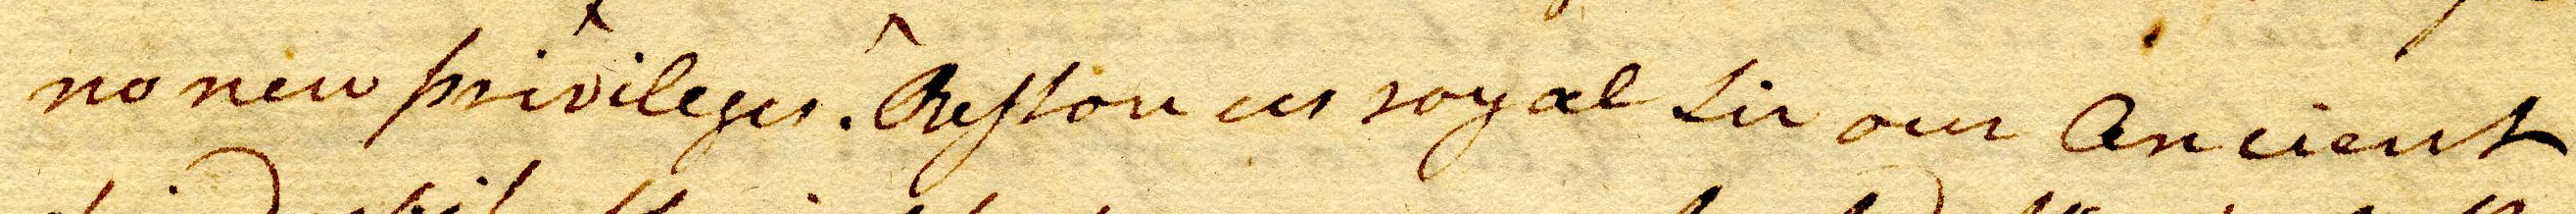no new privileges. Restore us royal Sir our Ancient
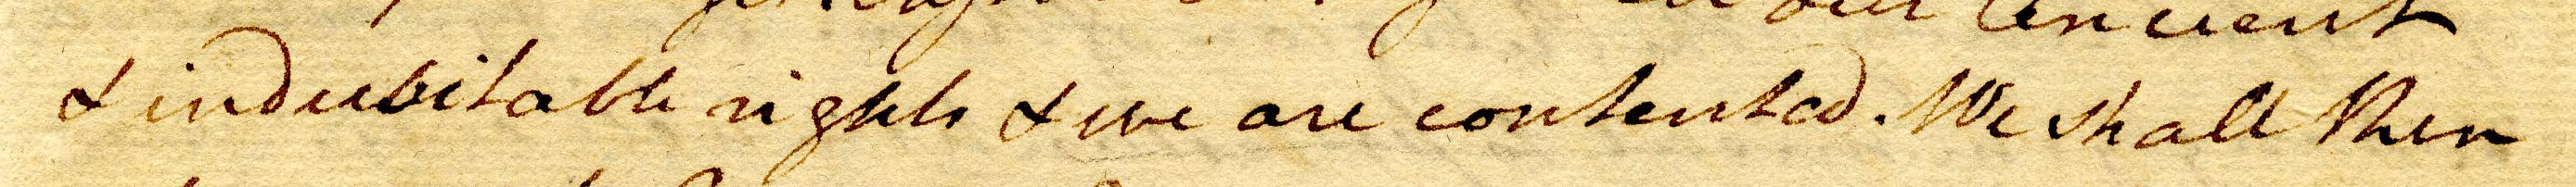& indubitable rights & we are contented. We shall then
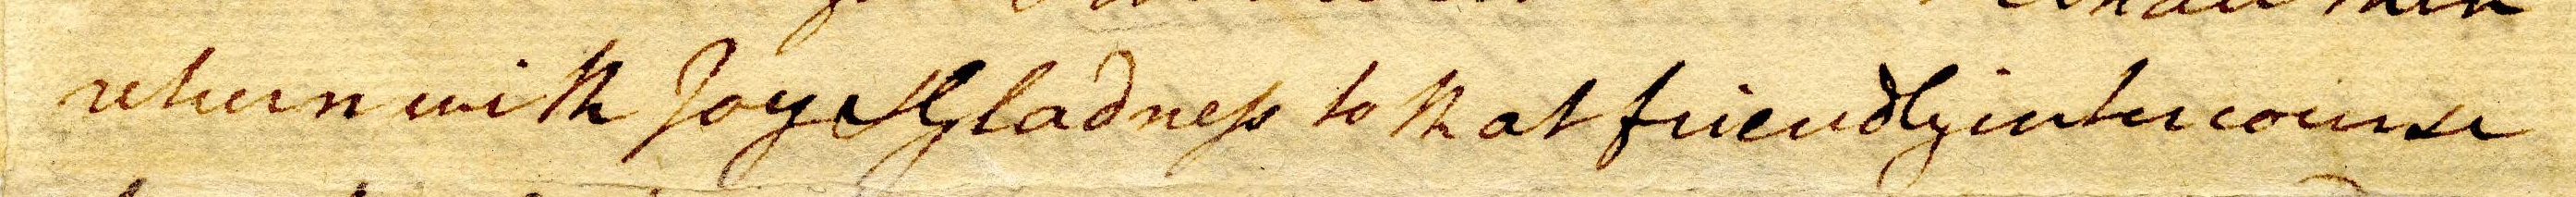return with Joy & Gladness to that friendly intercourse
